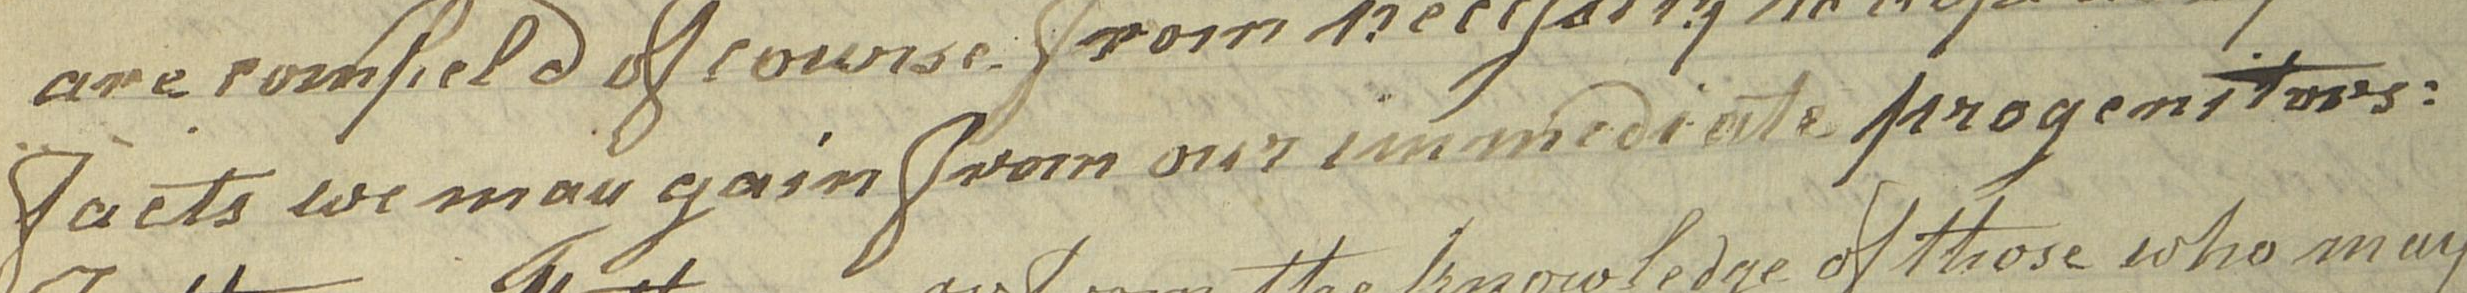facts we may gain from our immediate progenitors:
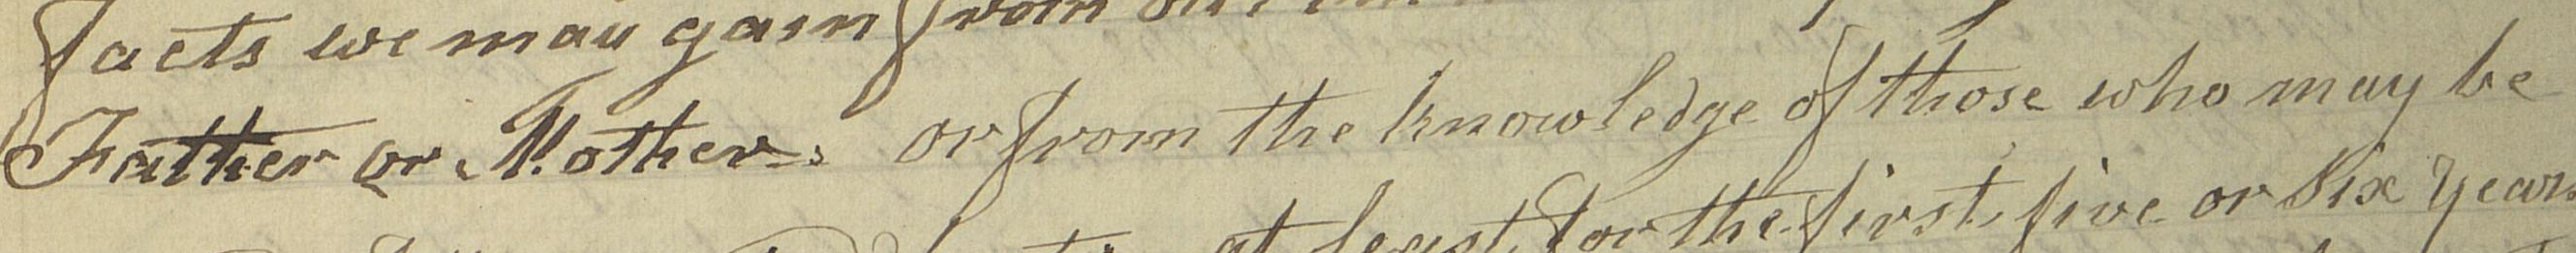Father or Mother, or from the knowledge of those who may be
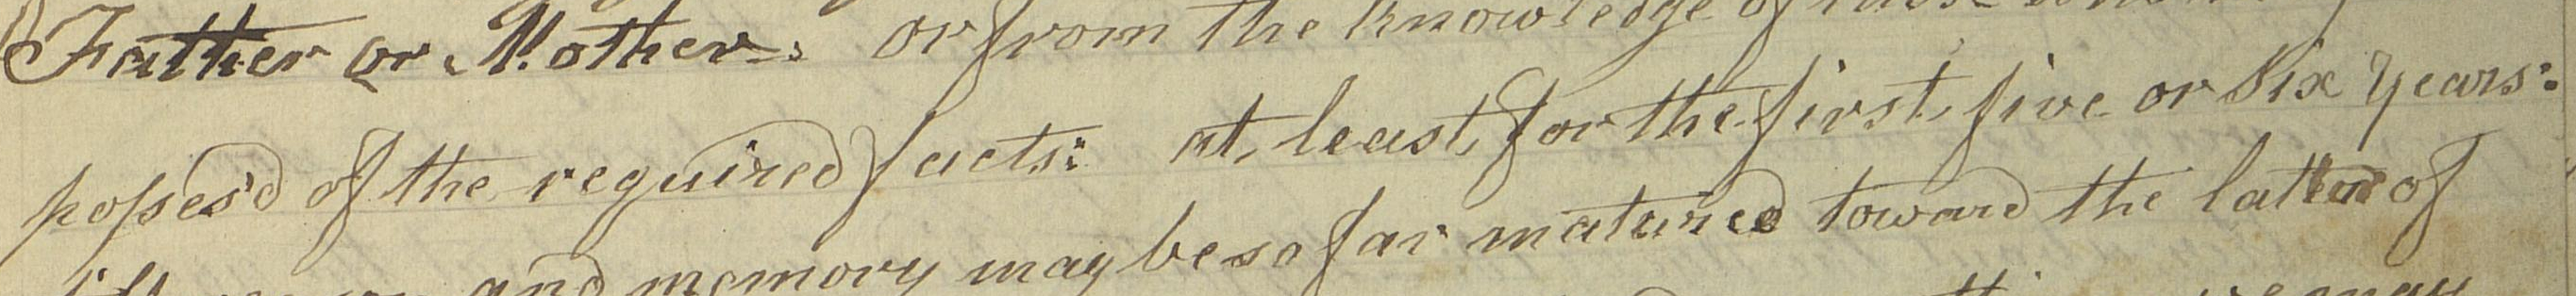posses'd of the required facts: at least for the first five or six years:
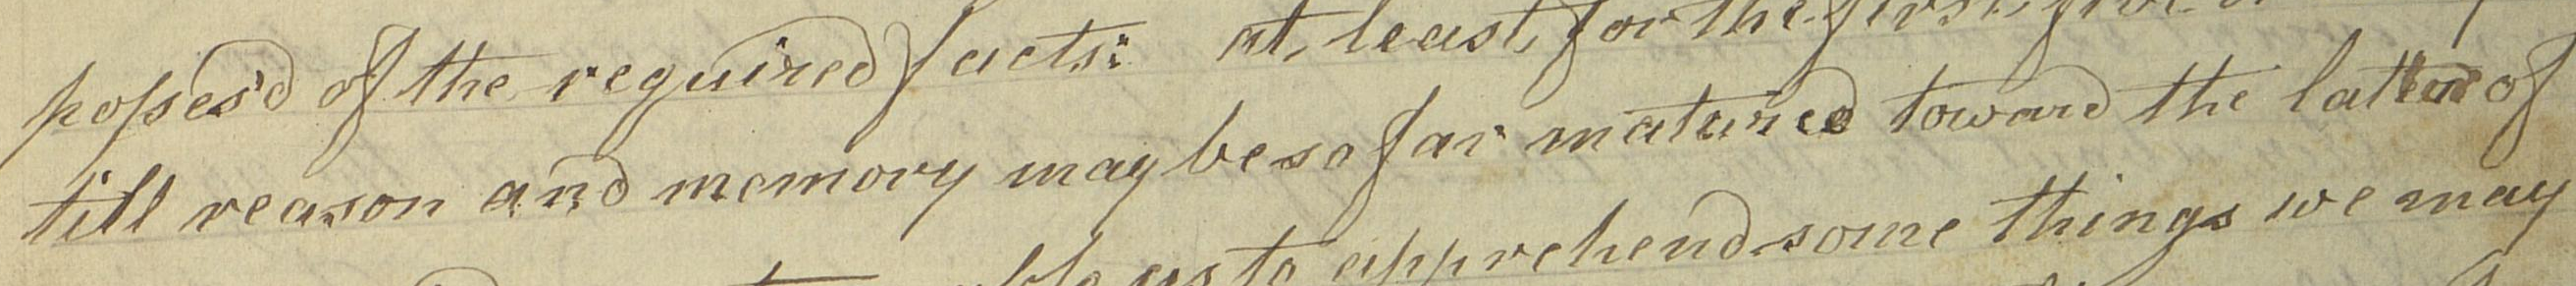till reason and memory may be so far matured toward the latter of
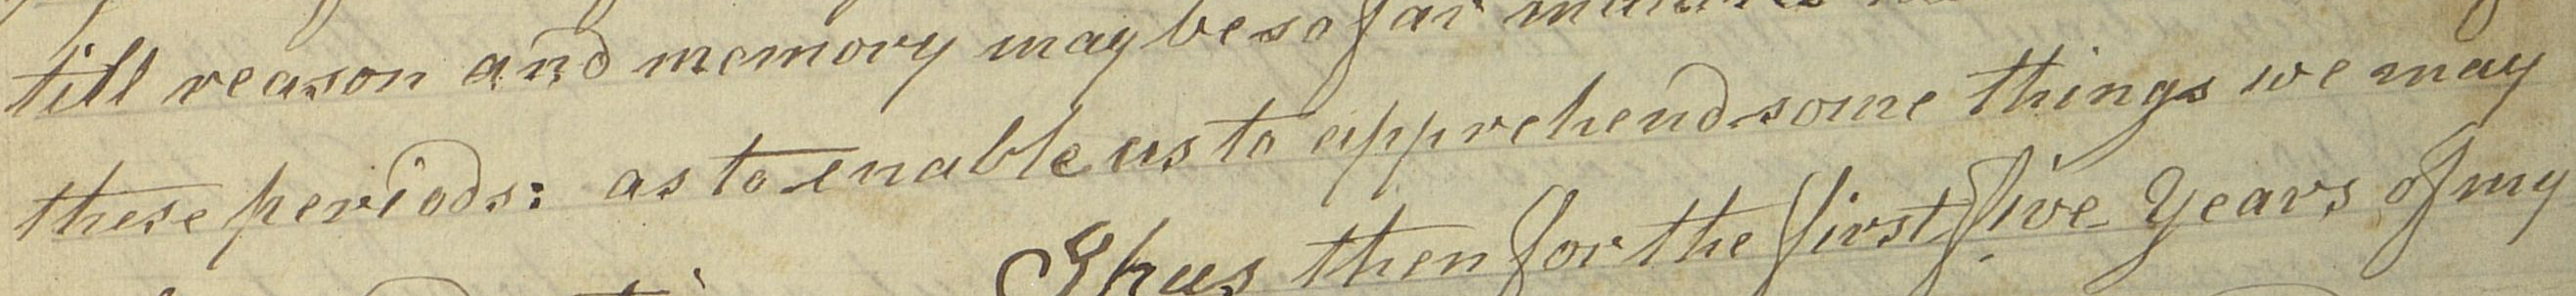there periods: as to enable us to apprehend some things we may
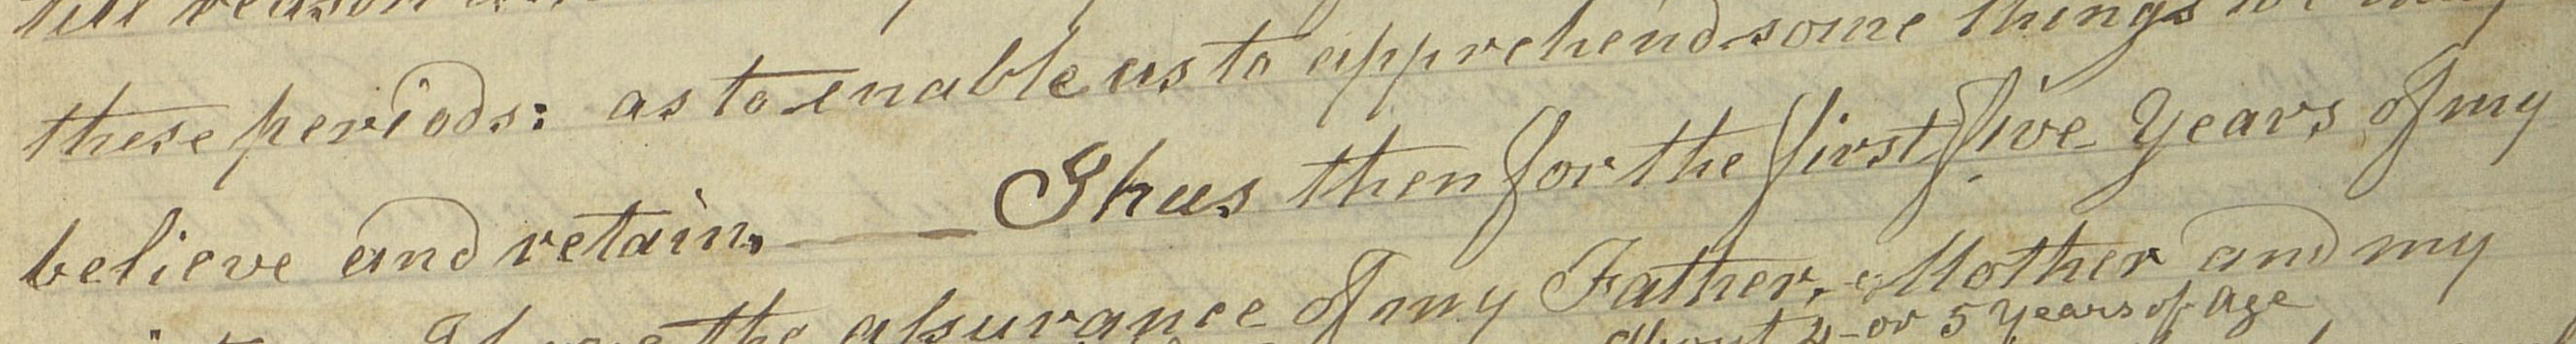believe and retain. Thus then for the first five years of my
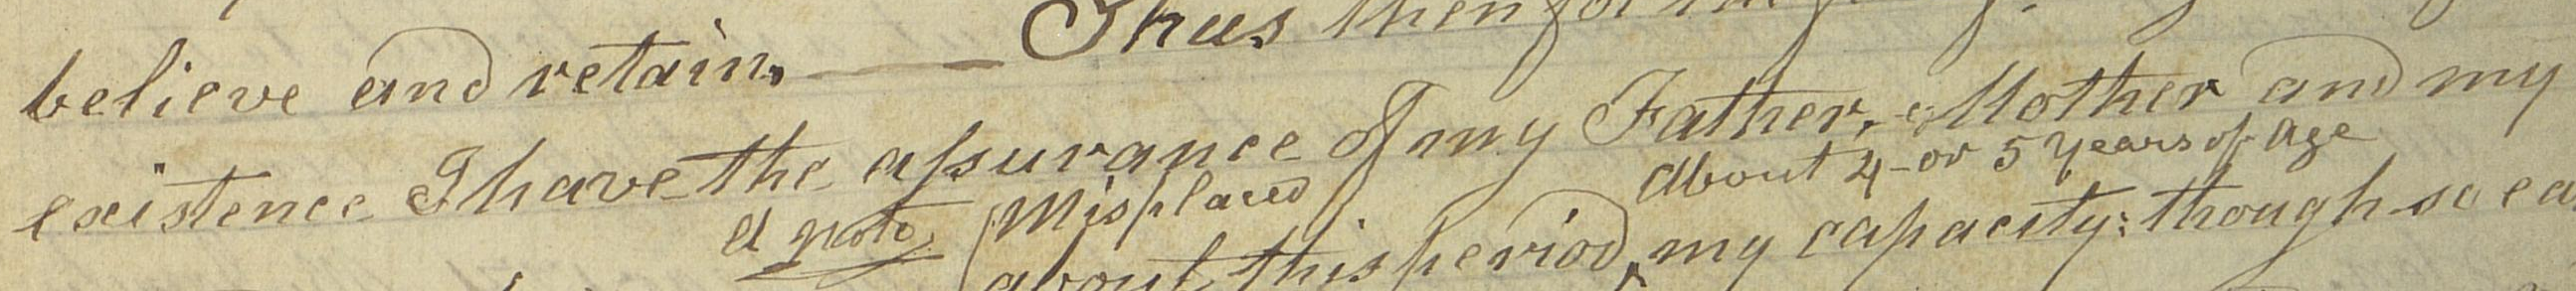existence I have the assurance of my Father, Mother and my
